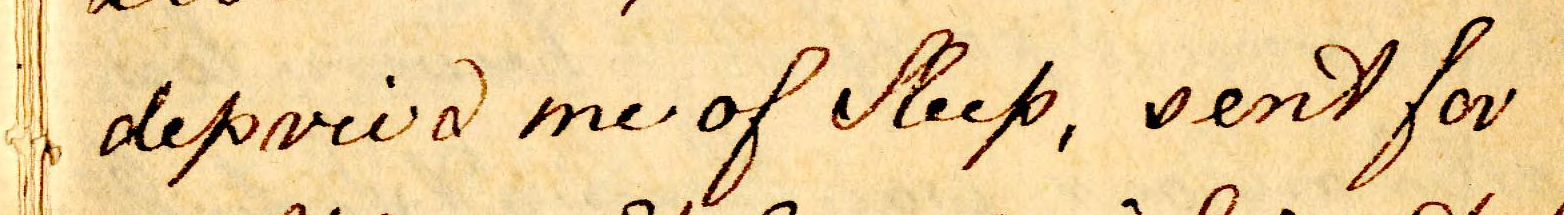deprivd me of Sleep, sent for
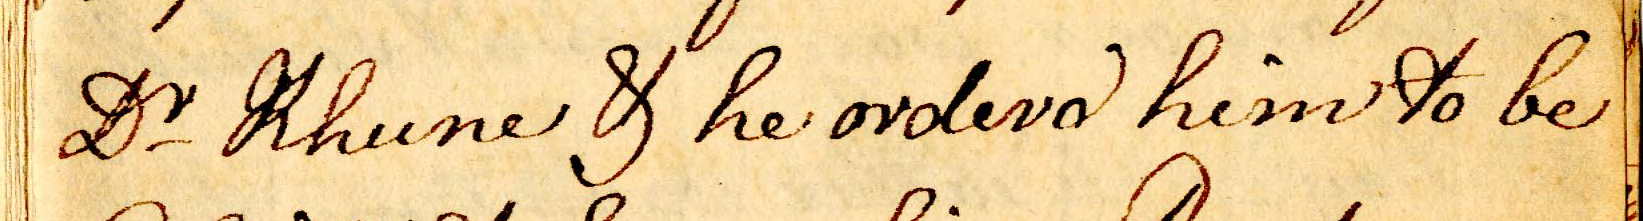D^r Khune & he orderd him to be
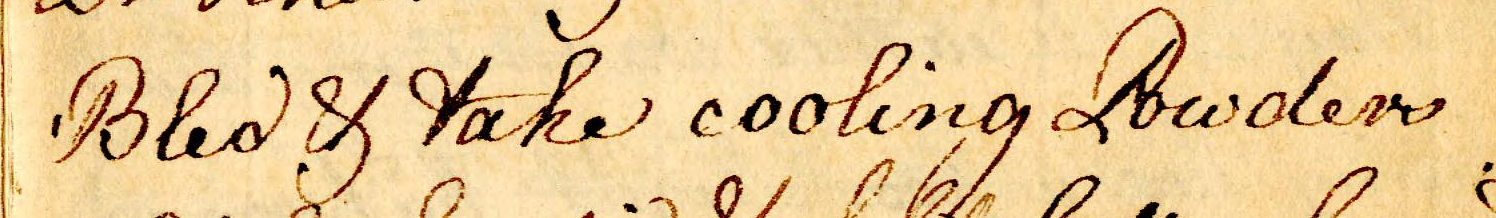Bled & take cooling Powders
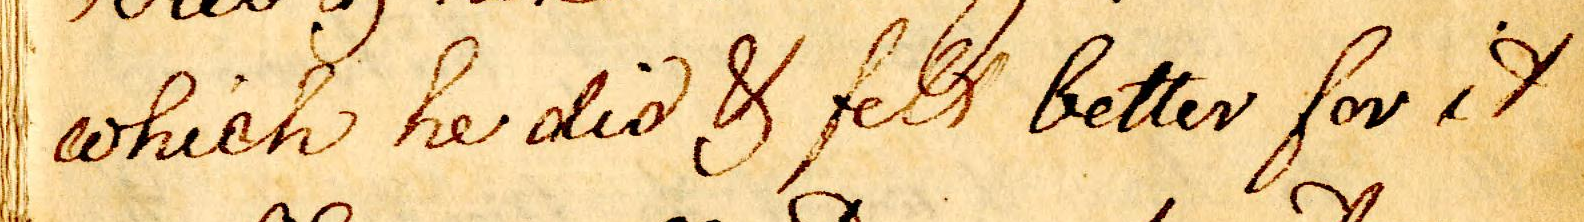which he did & felt better for it
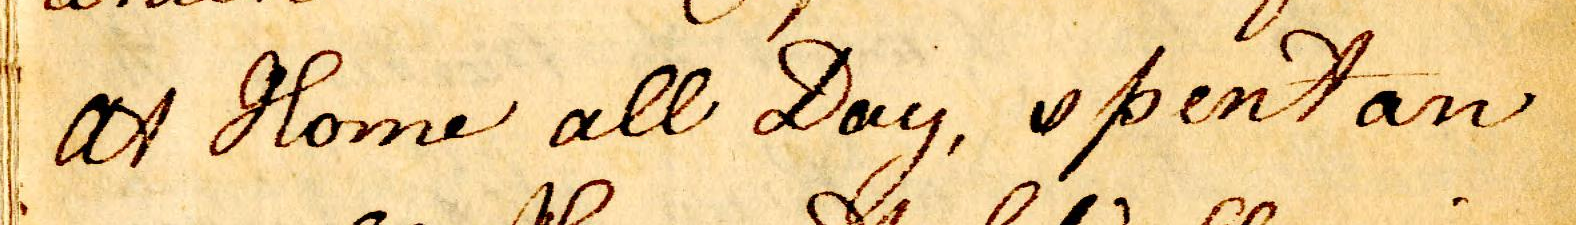At Home all Day, spent an
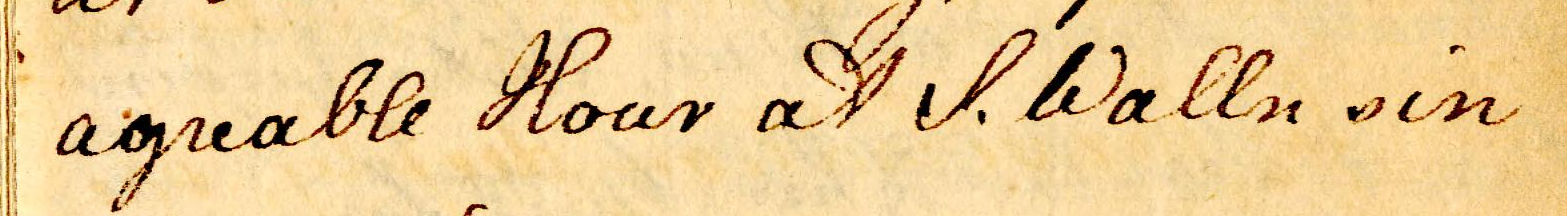agreable Hour at S. Waln sin
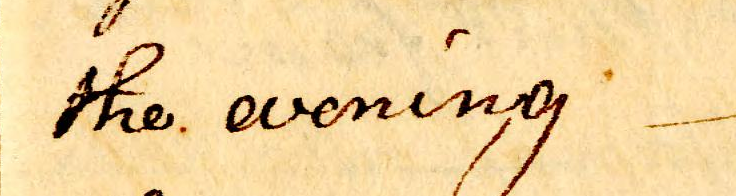the evening
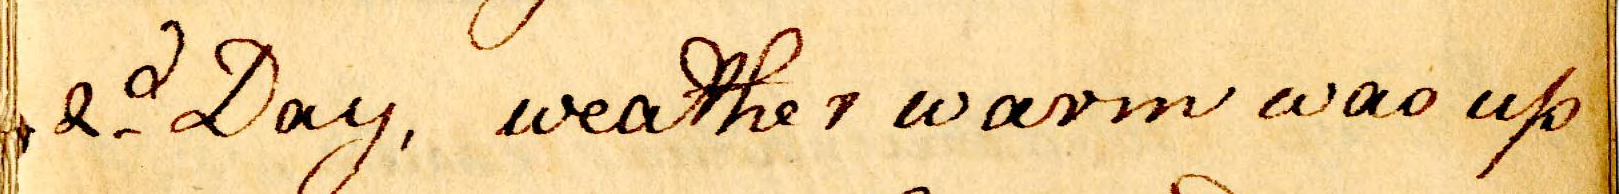2^d Day, weather warm was up
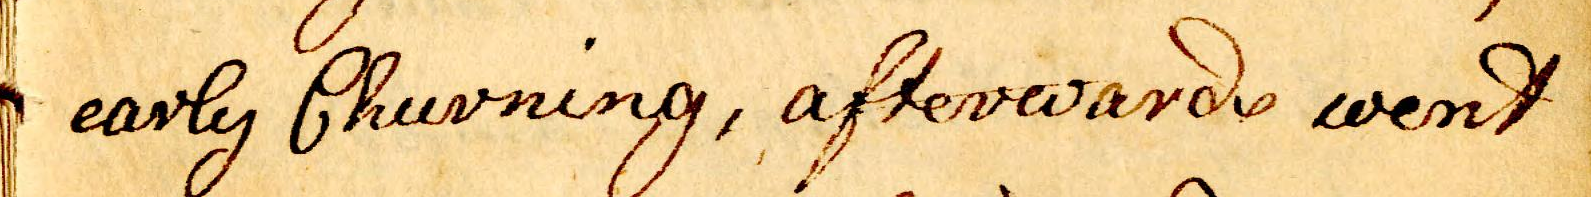early Churning, afterwards went
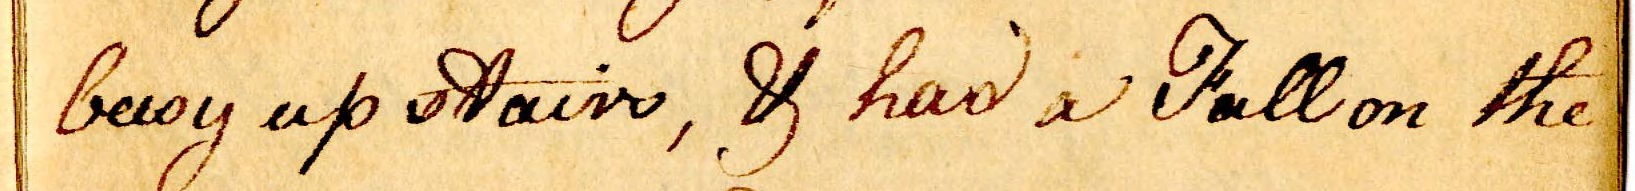busy up stairs, & had a Fall on the
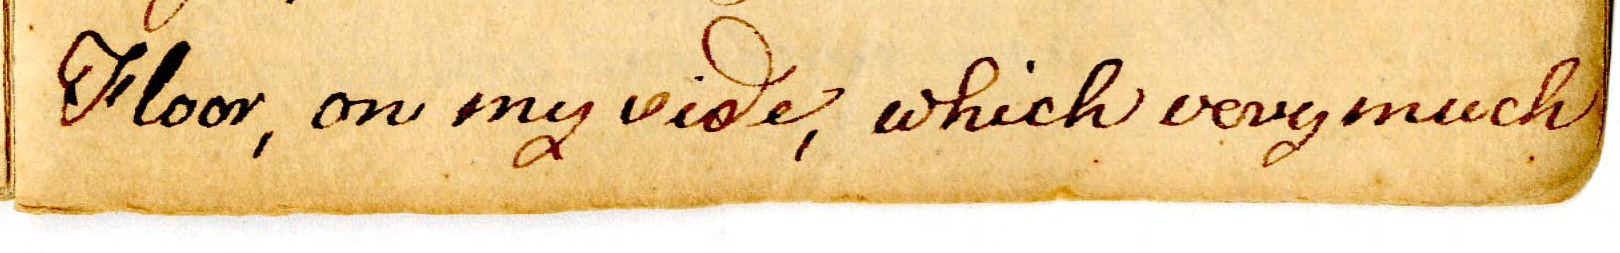Floor, on my side, which very much
